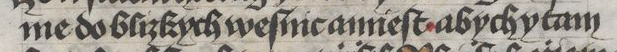mé do blizkych weſnic a mieſta.abych y tam
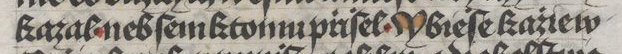kažalni neb sem k tomu pṙiẛel.Y bíeẛe każiew
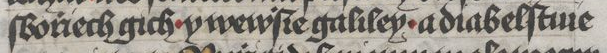ſboṙíech gich.y wewẛie galiley.a diabelſtuie
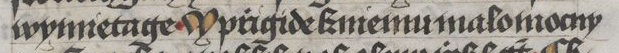wymíetage.Ypṙigide k nemu malomocny
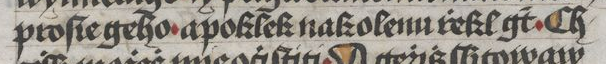proſie geho.a poklek nakolenu ṙekl ḡt Ch¬
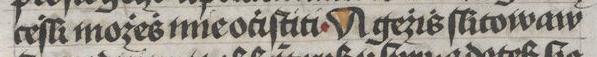ceẛli możeṡ mie oċiſtiti.A geżíṡ ſlitowaw
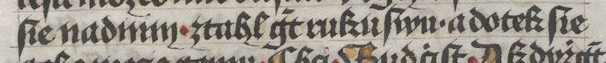ſie nad nim.ztahl ḡt ruka ſwu.a dotek ſie
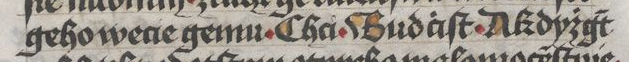geho wecie gemu.Chci.Bud ċiſt.A když ḡt
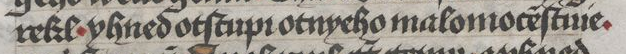rekl.yhned otſtupí ot neho málonotéſtníe.
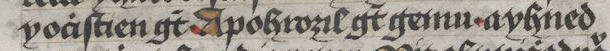y oċiſtien ḡt Apohrozil ḡt gemu.a yhned
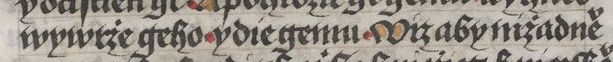wywrże geho y die gemu.Viz aby niżadnev
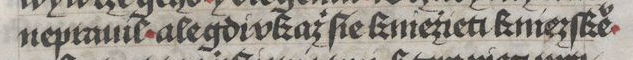nepravil.ale gdi ukaż ſie kníeżieti kniezſkev.
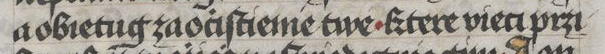a obietug za oċiſtienie twé.ktere wiecz przi¬
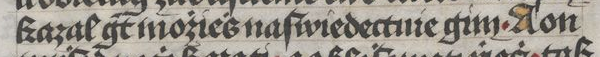kazal ḡt możieṡ na ſwiedectuíe gim.A on¬
